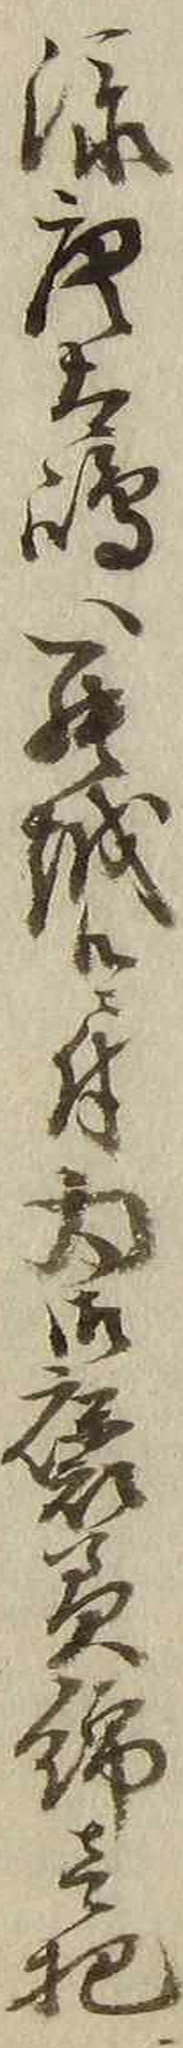添唐太島へ罷越候ニ付為御褒美綿壱把
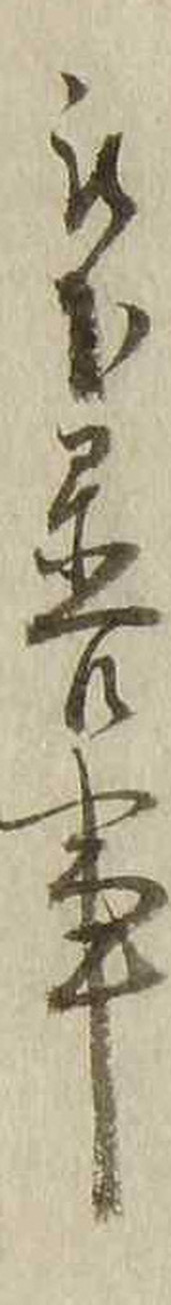被下置候事
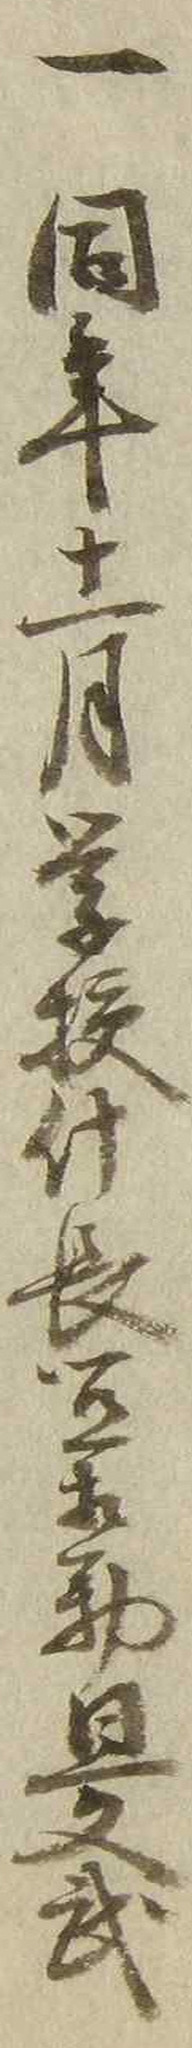一同年十一月学校什長宜相勤且文武
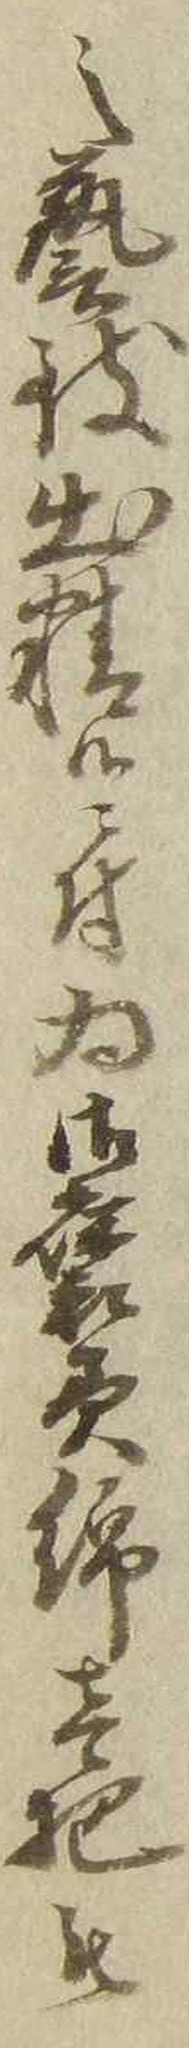之芸致出精候ニ付為御褒美綿壱把被

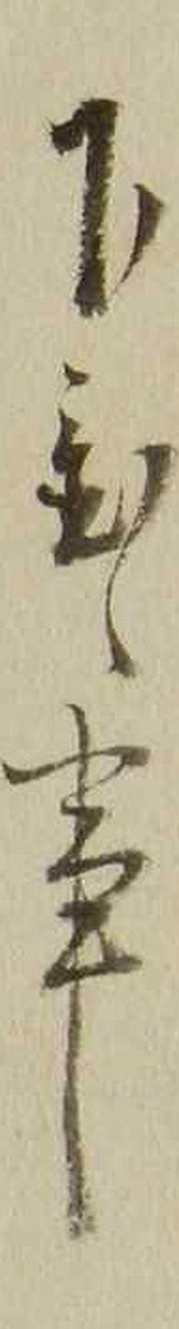下置候事
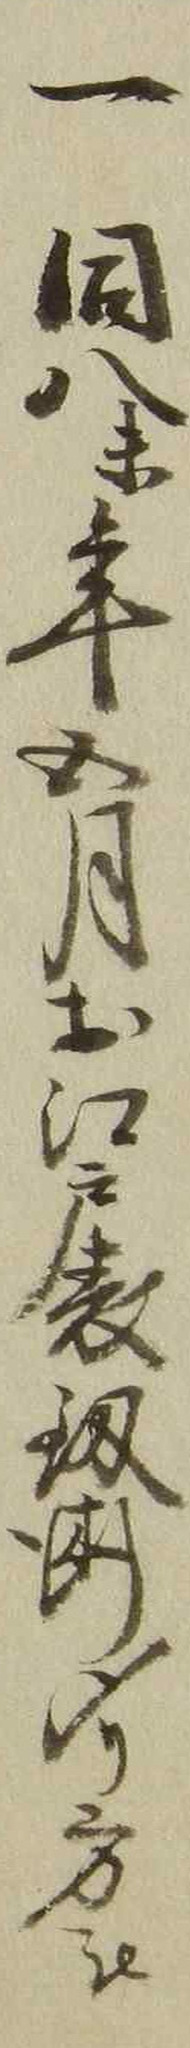一同八未年五月於江戸表剣術〆り方被
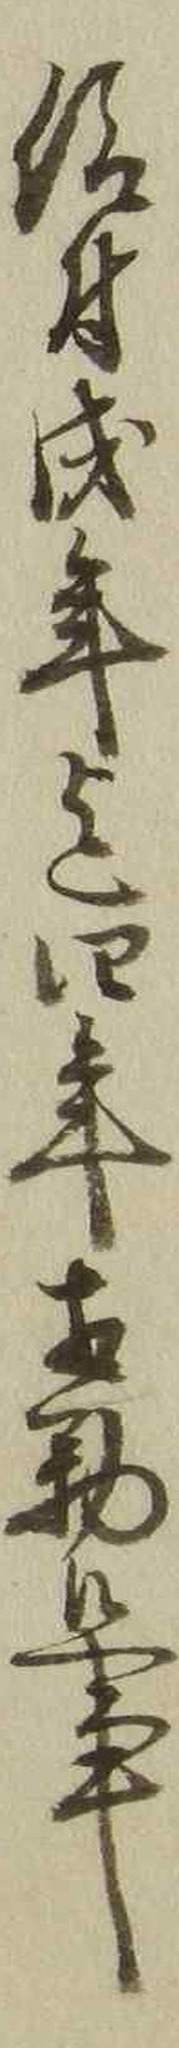仰付戌年迄四年相勤候事
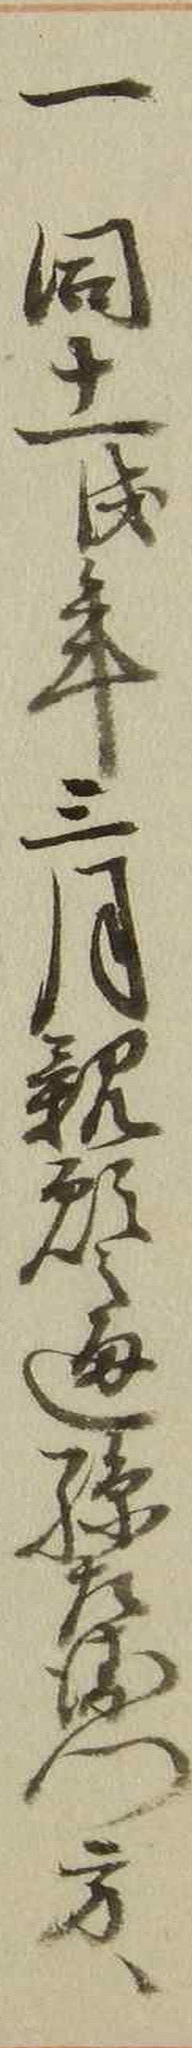一同十一戌年三月親願之通孫左衛門方へ
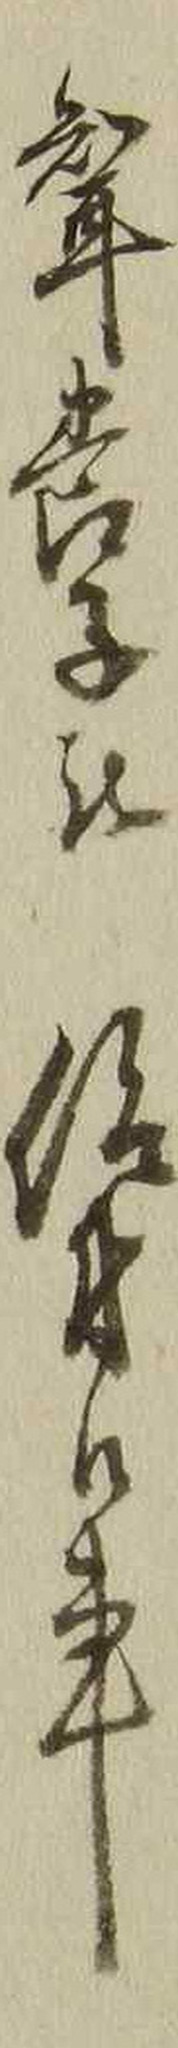婿養子被仰付候事
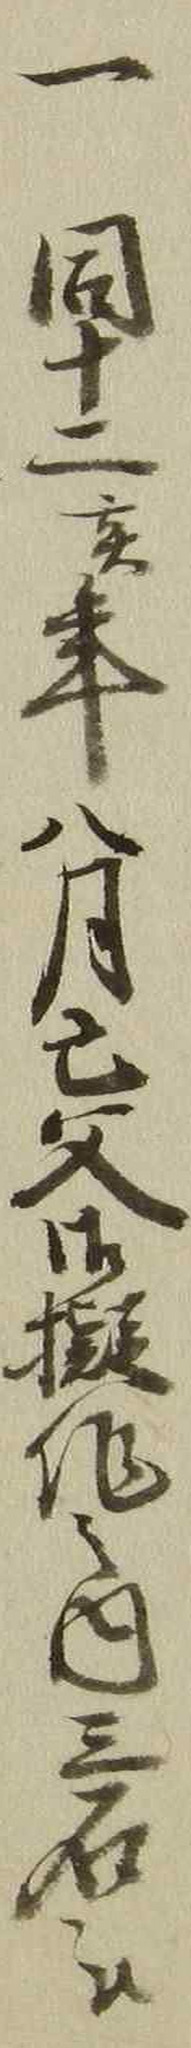一同十二亥年八月亡父御擬作之内三石被
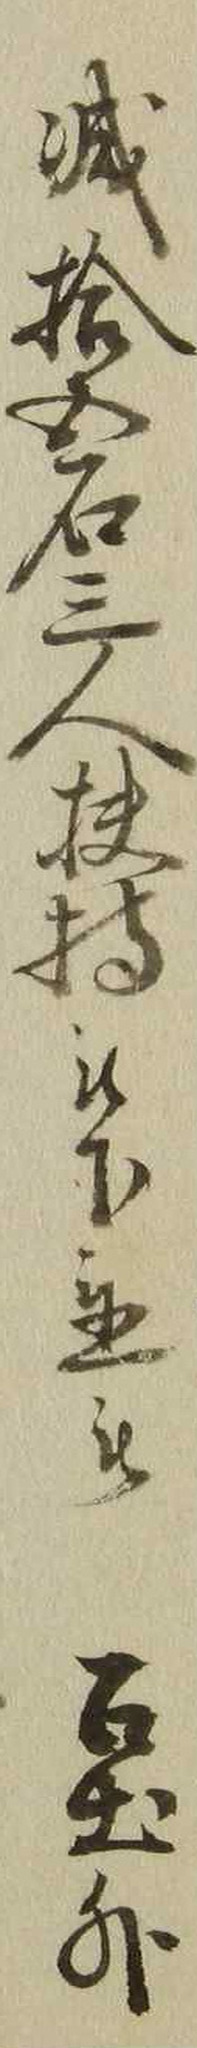減拾五石三人扶持被下置被召出外
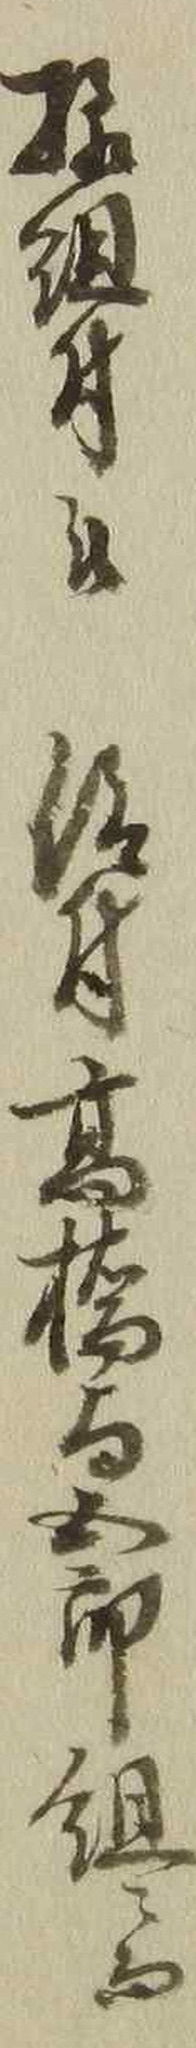様組付被仰付高橋与五郎組ニ而
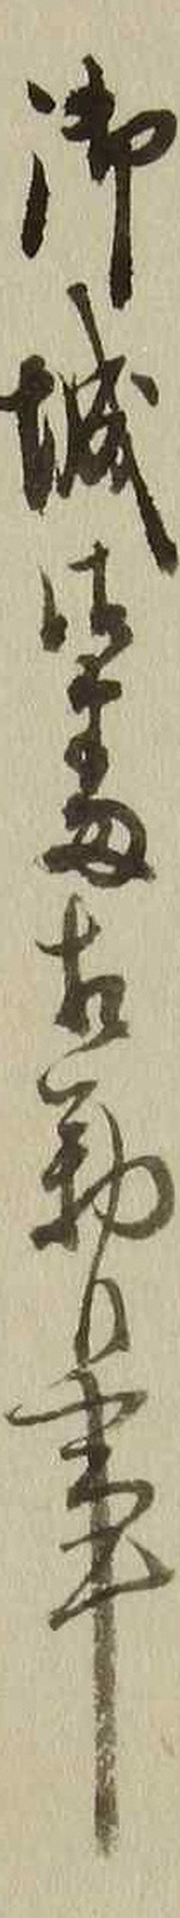御城御番相勤候事
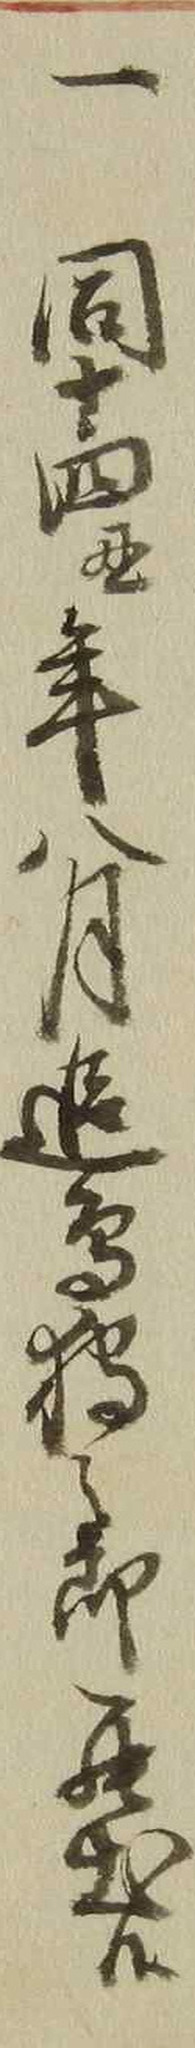一同十四丑年八月追鳥狩之節罷出候
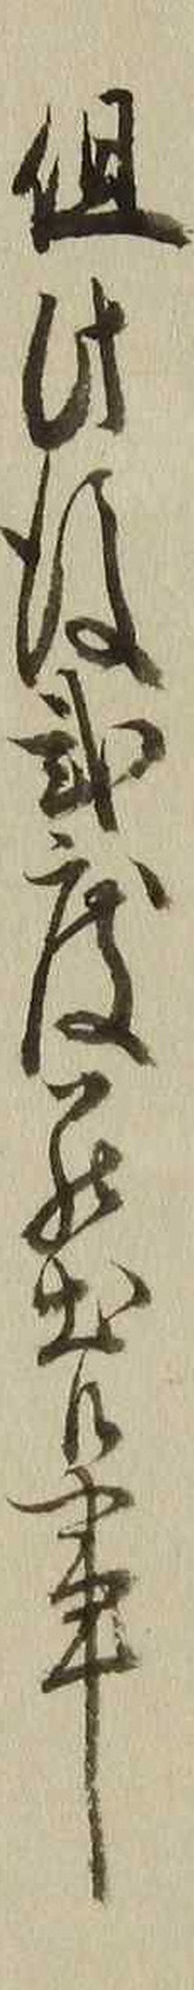但此後弐度罷出候事
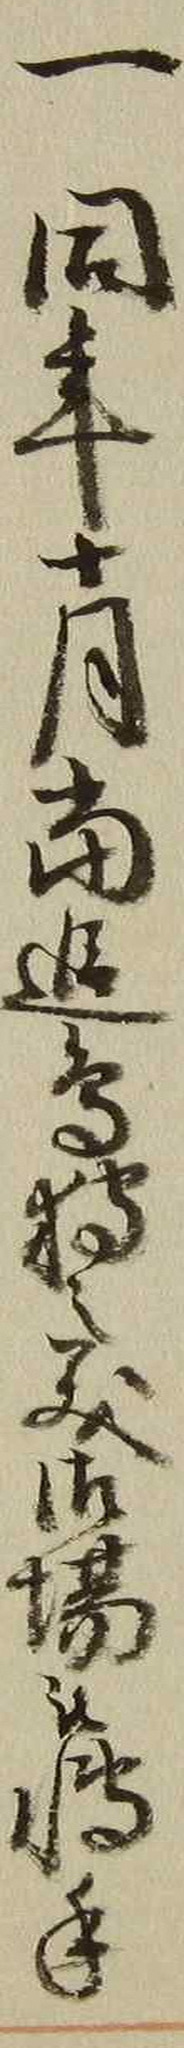一同年十月当追鳥狩之義御場被転手
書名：諸士系譜　巻之53　に之部4
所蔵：会津若松市立会津図書館
